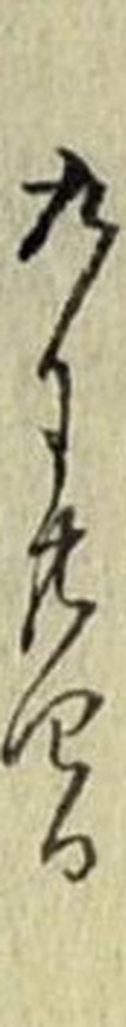九月廿四日
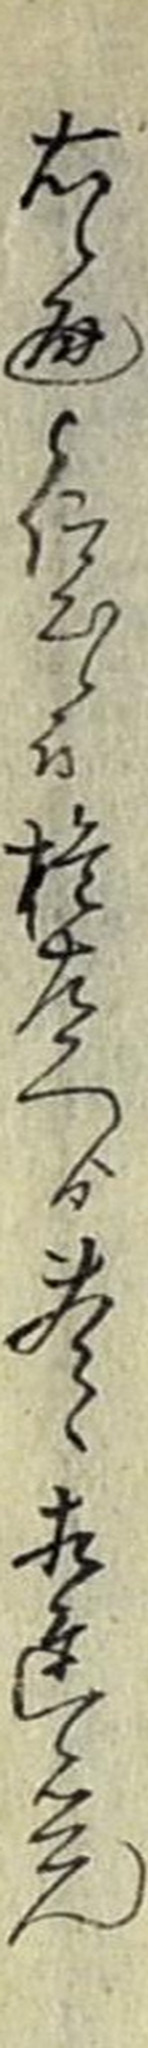右之通被仰出候に付権左衛門ゟ夫々へ相達覚
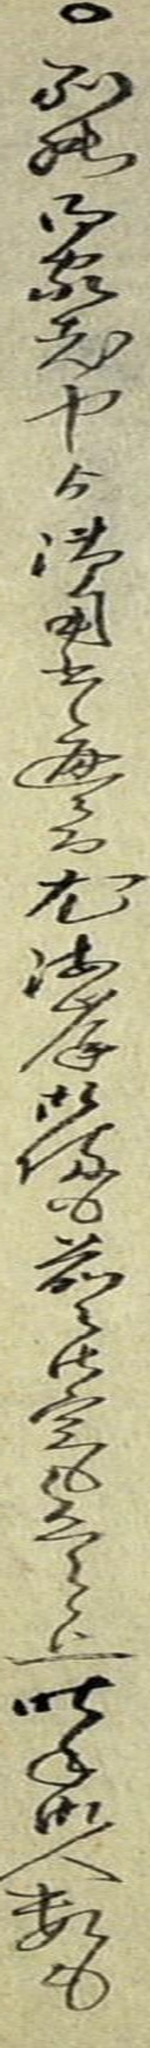○別紙御家老中ゟ御用書之通に而尤海岸御備も前々御定も有之候上昨年御人数も
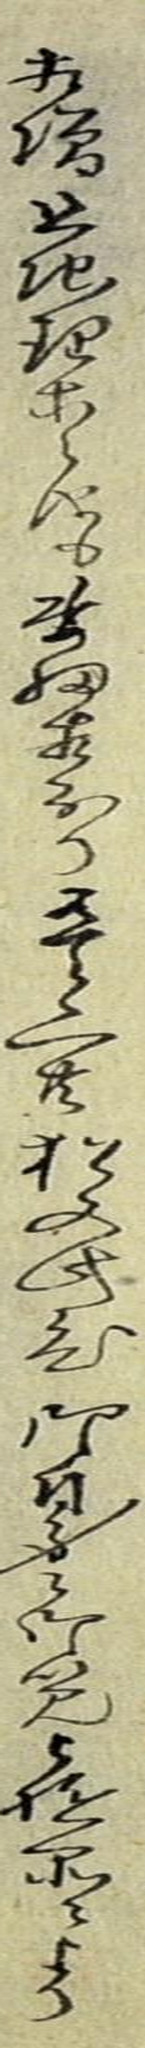相増且地理等之儀も委細相分り有之候へ共猶又此度御自身に御覧被遊品により
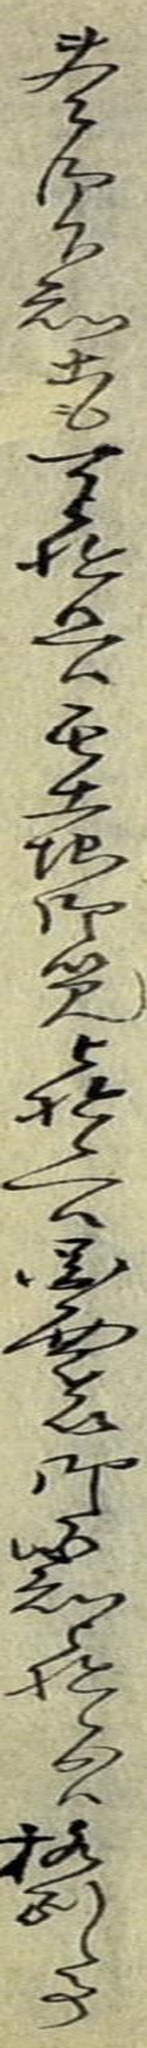夫々御下知等も可被遊且は其土地御覧被遊候へは図面を以御承知被遊候ゟは格別之事
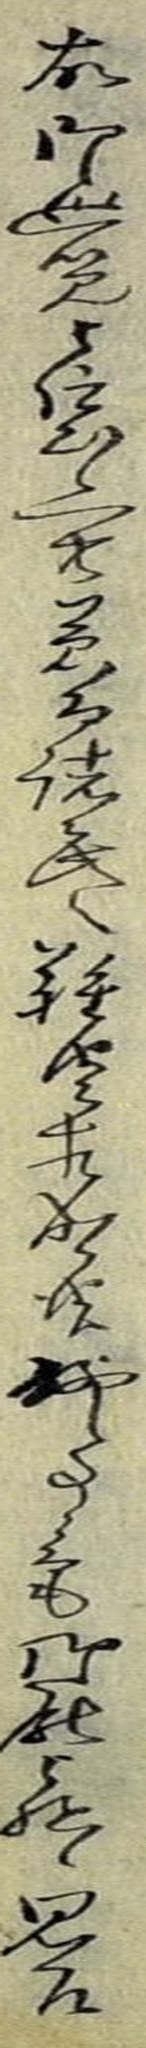故御巡覧被仰出候へ共兼而諸民へ難儀に相成候儀は聊之事に而も御聴被遊候思召
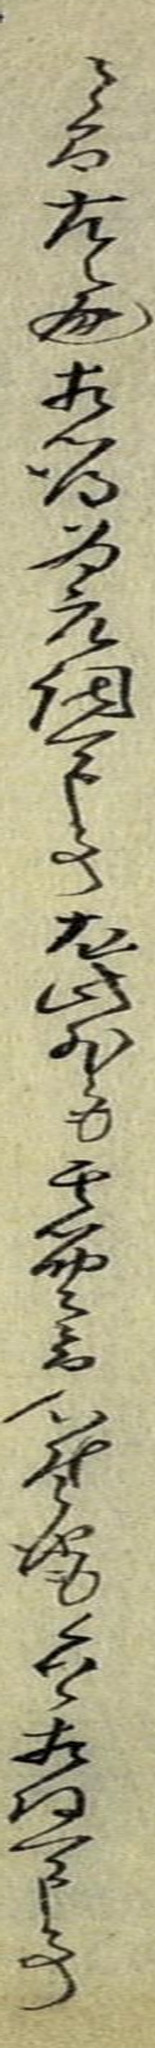に候間左之通相心得為取調可申事尤此外も其筋々に而心付之儀も候はヽ相伺可申事
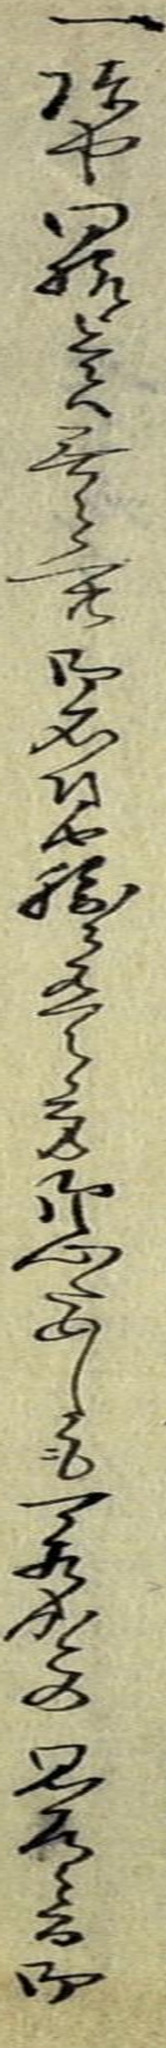一陣中同様迄には無之候へ共御不自由勝に有之候旁御心ためにも可相成との思召候間御
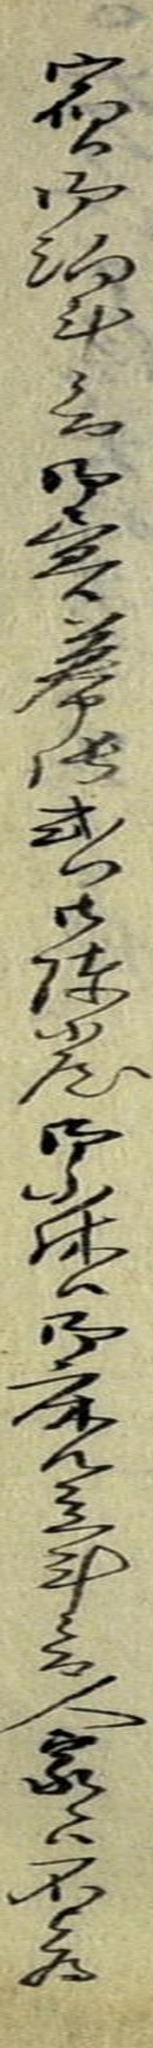宿は御泊斗に而御昼は幕張或は御陣小屋御小休は御床几立斗に而人家へは不被為
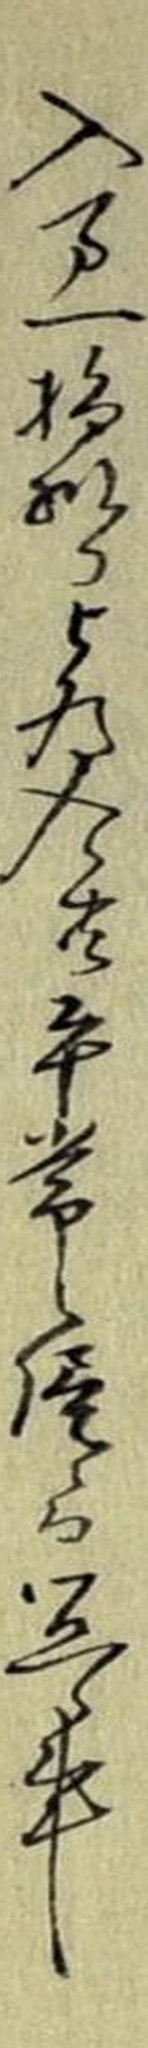入万一指掛り被為入候共平常之侭に而宜候事
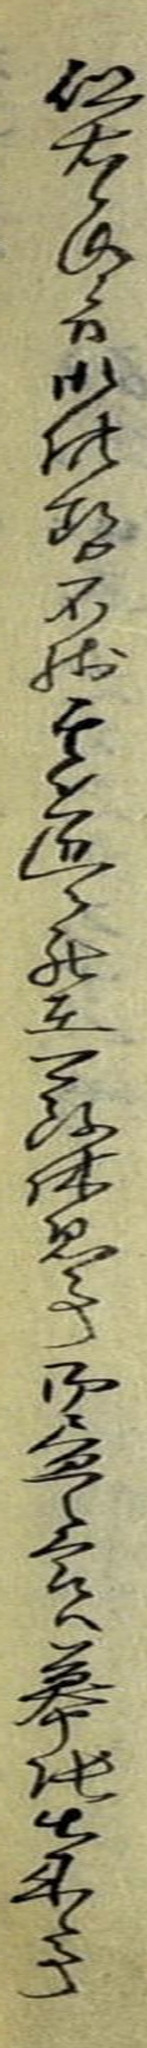但右之趣に付御供勢不残其近辺へ罷在可致休息事御昼之節は幕張出来候事
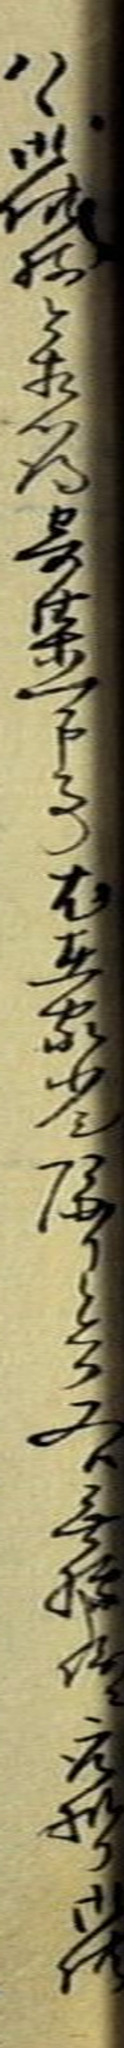はヽ御供揃と相心得寄集可申事尤在家少し隔りしとか又は無拠儀に取掛り御供
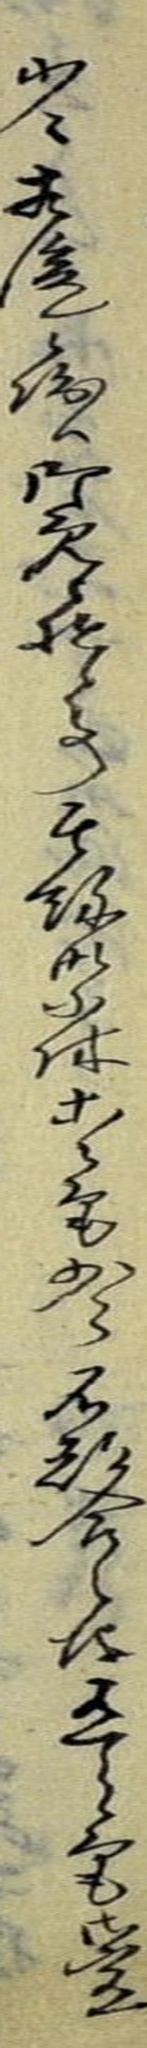少々相後レ候儀は御免被遊候事其餘御小休等に而少々不都合之儀有之候而も御宥
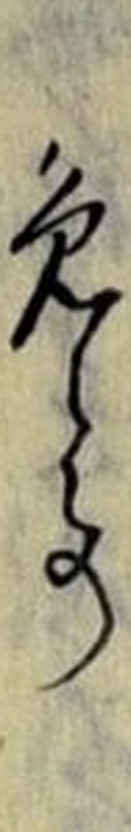免候事
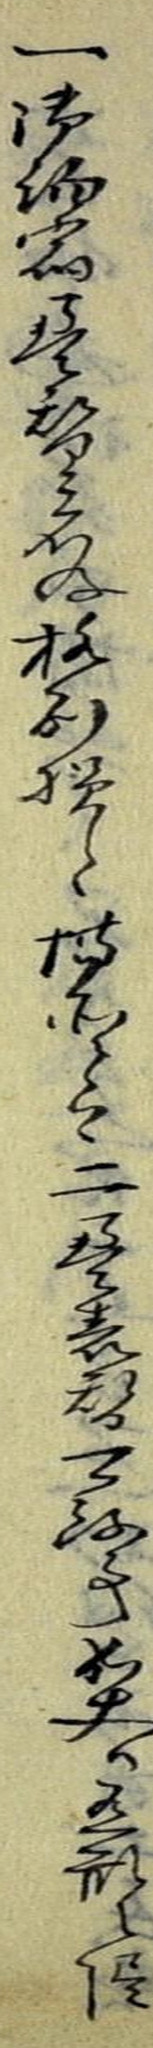一御泊宿畳替に不及格別損し候場所に候はヽ二畳表替可致事成丈は有形之侭
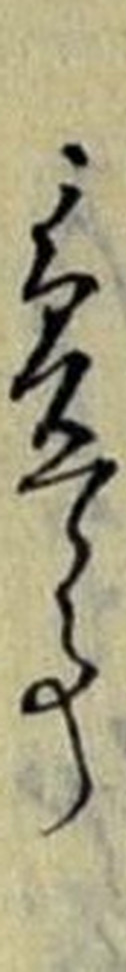に而宜候事
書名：命令之部 六
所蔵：福井県文書館 Fukui Prefectural Archives
